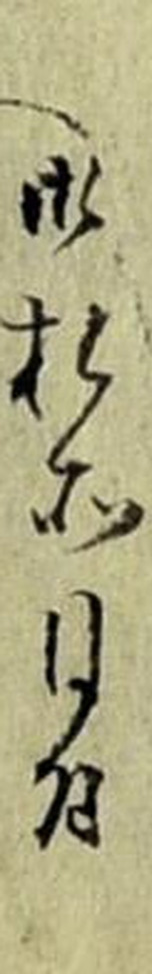御札所目付
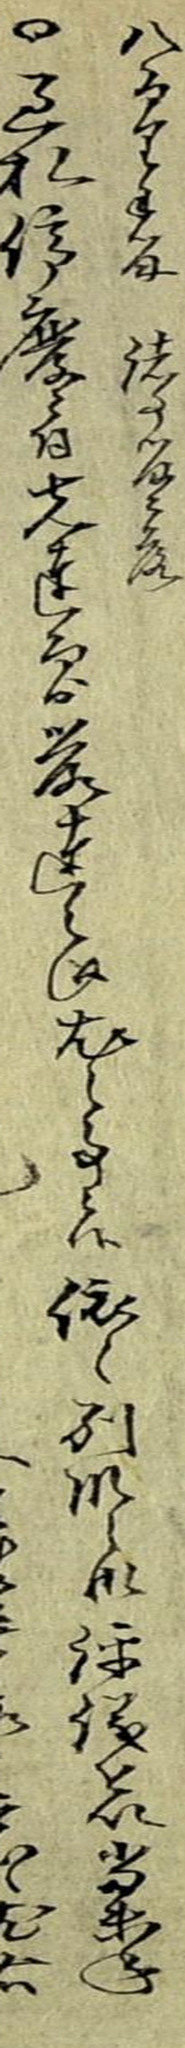○過札停廃に付先達而ゟ厳達之趣尤之事に候依之別段之御評議を以当未年
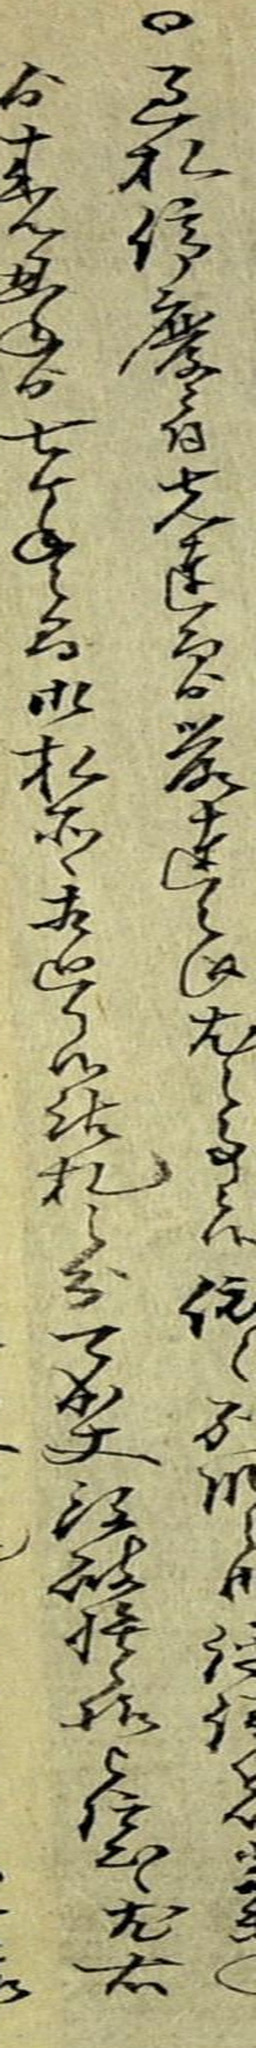ゟ来ル丑年ゟ七ヶ年之間御札所へ相廻り候銀札之分可成丈致破捨候様被仰出候尤右
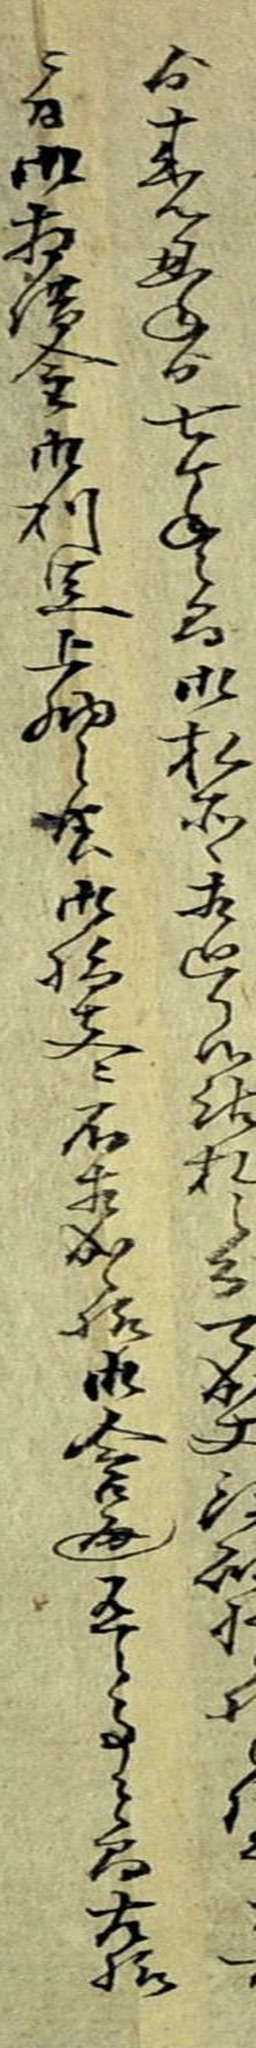に付御拝借金御利足上納之儀は御指支に不相成候様御含通有之事に候間左様
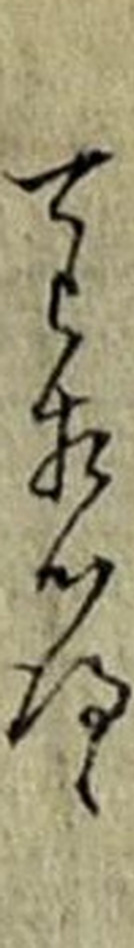可被相心得候
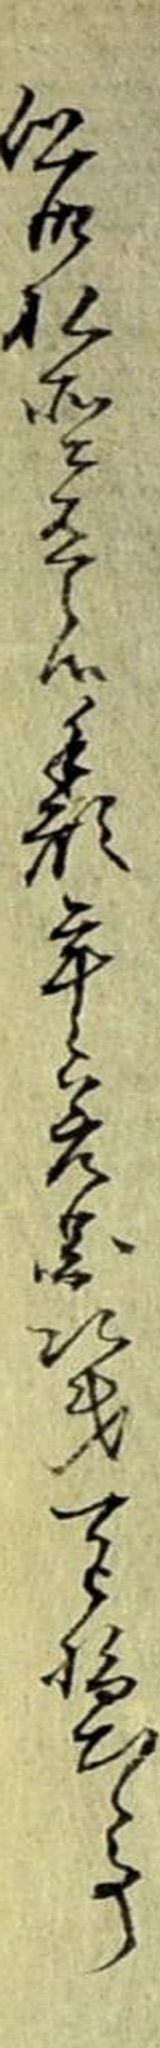但御札所に有之候手形年々差図次第可被指出候事
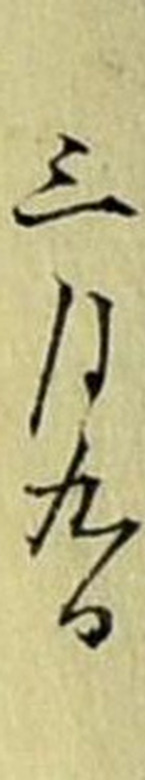三月九日

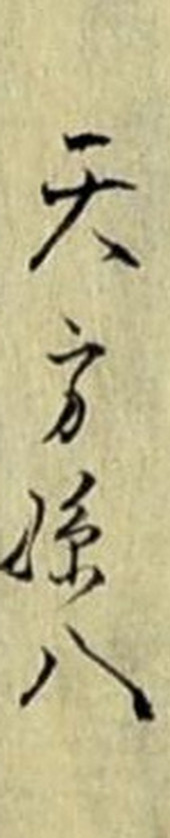天方孫八
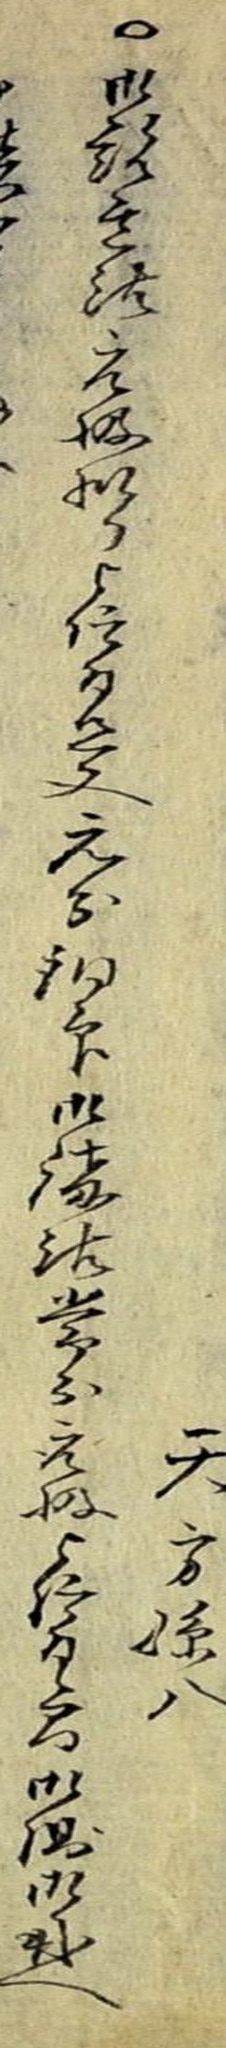○御趣意銀取扱掛リ被仰付且又元分銅印御講銀当分取扱被仰付候間御側御用人
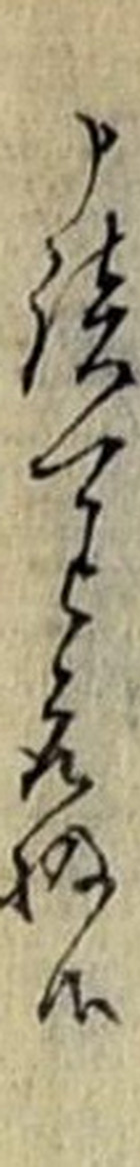申談可被取扱候
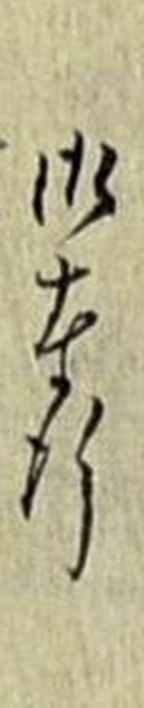御奉行
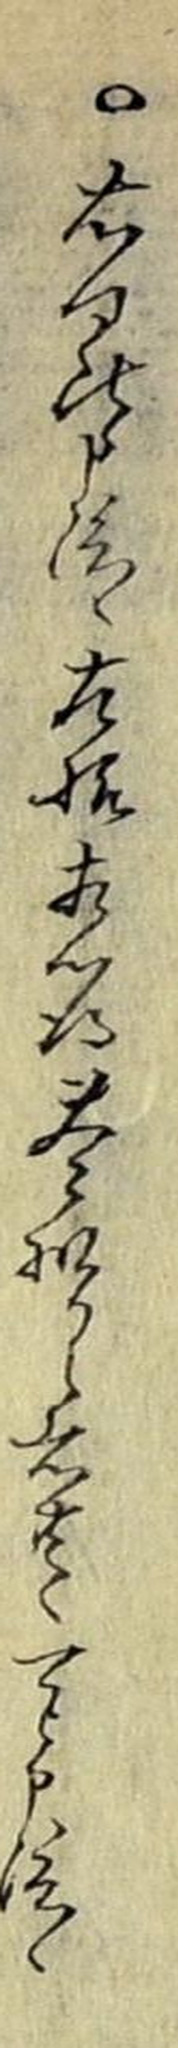○右同断申渡候左様相心得夫々掛り之者共へ可被申渡候
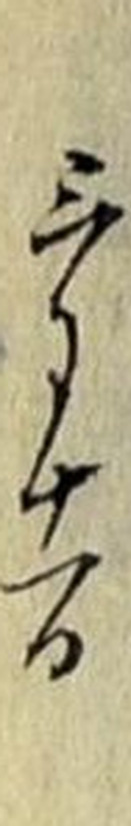三月十一日
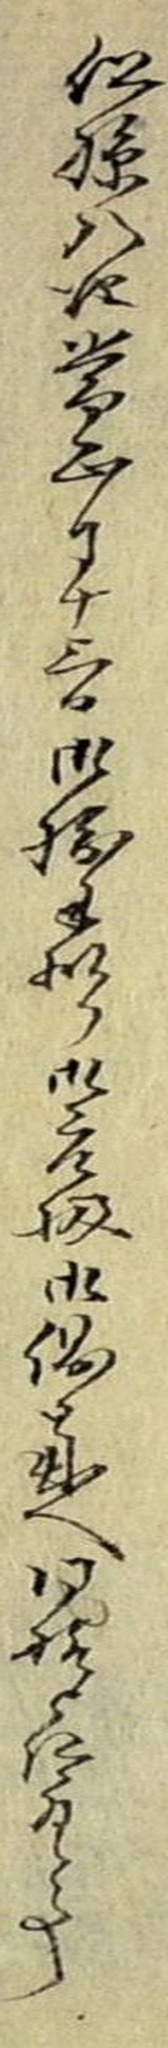但孫八儀当正月十三日御勝手掛り御取扱御側御用人同様被仰付候事
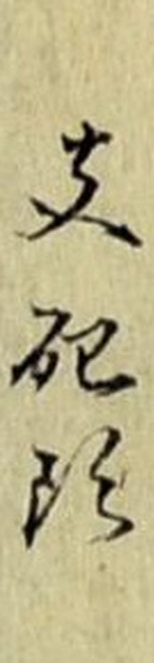支配頭
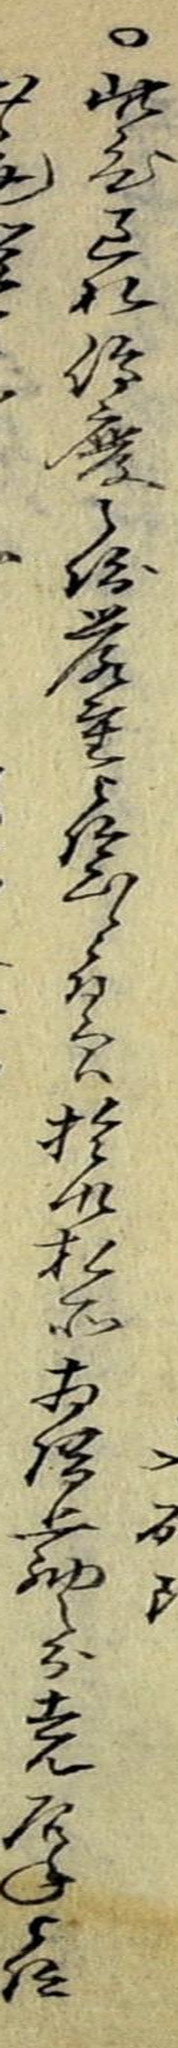○此度過札停廃之儀厳重被仰出候に付而は於御札所拝借上納之分去ル辰年被仰
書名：命令之部 六
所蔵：福井県文書館 Fukui Prefectural Archives
